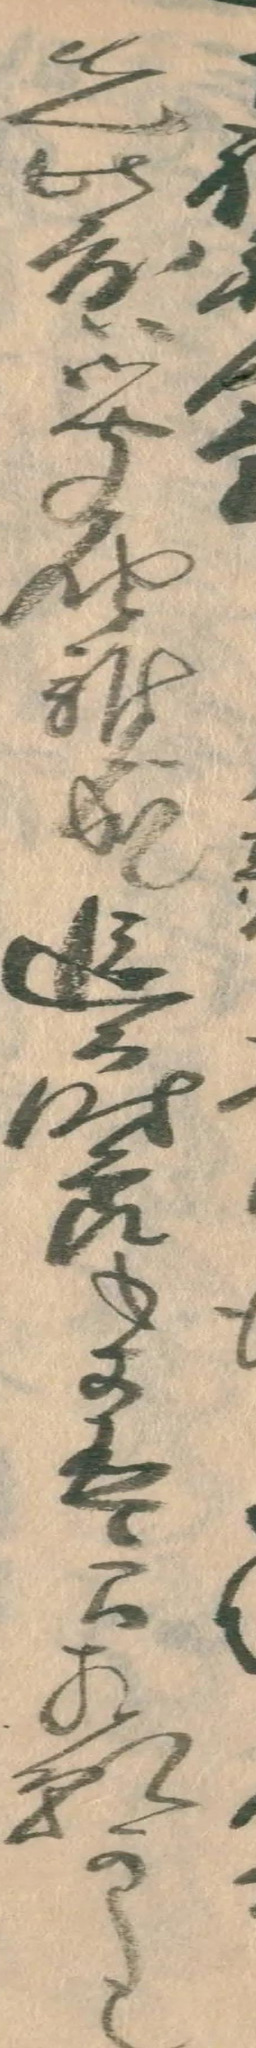先此度ハ御聞届難成候追而時節も可有候間相願可申也
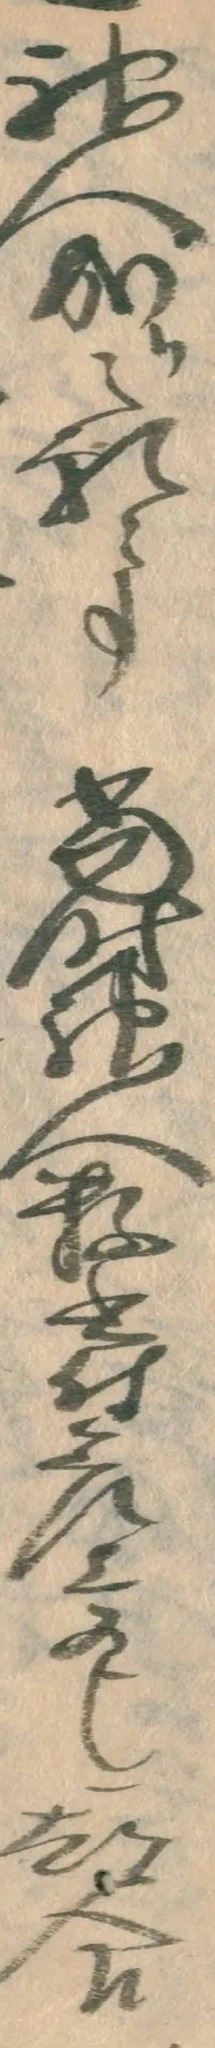一神人成り之願之事当時神人数書付差上可申候都合
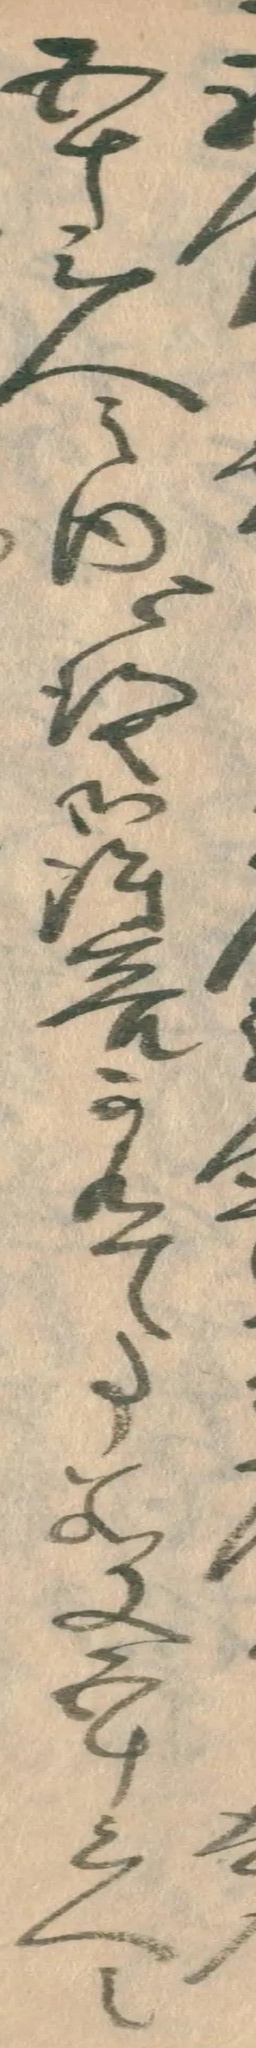五十三人之内候得者御許容可有之事若又五十三人之
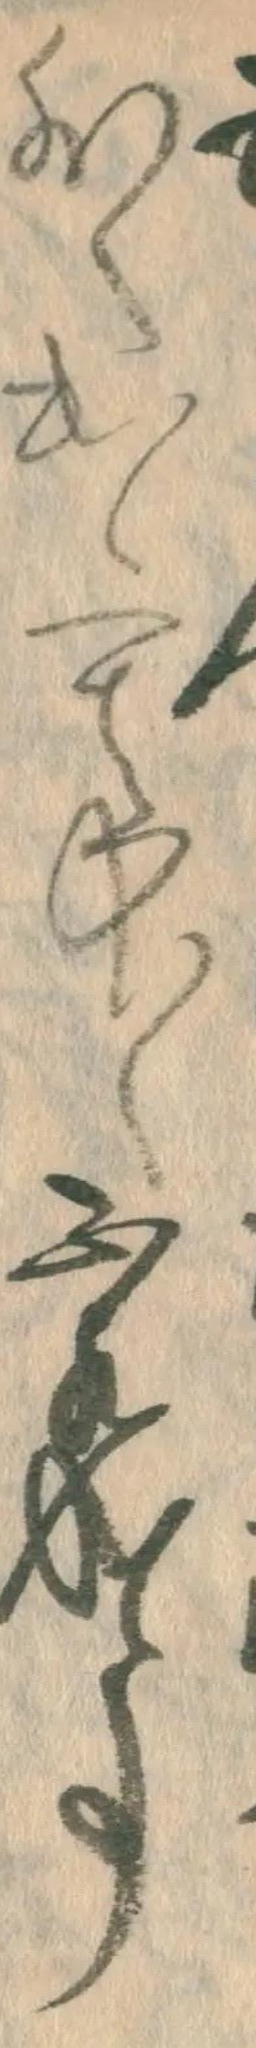外へ出候へ者中〳〵不相成候事
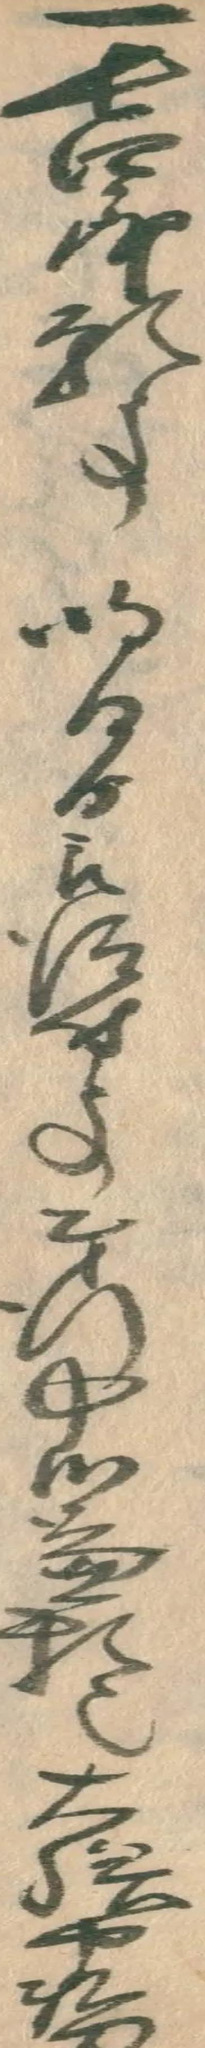一長四郎願事明日ゟ被仰付事奉行中御兼頼也大膳中務
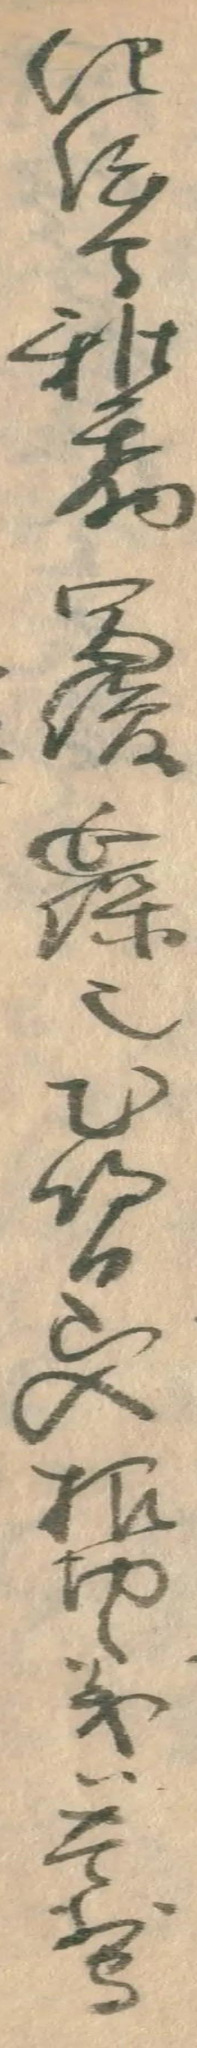紀伊守雅楽助富俊季宝延保也尤明日山入根切之義ハ豊前守

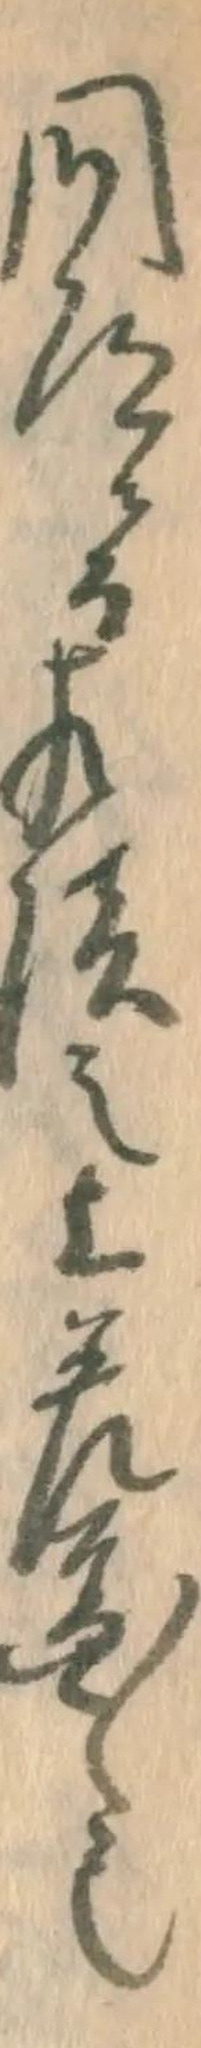同道ニ而相談之上差図候也
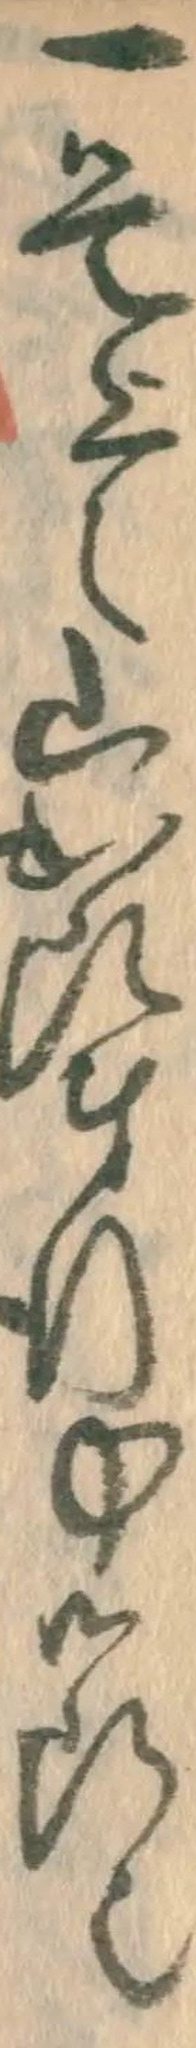一是上之山出頭奉行中御断也
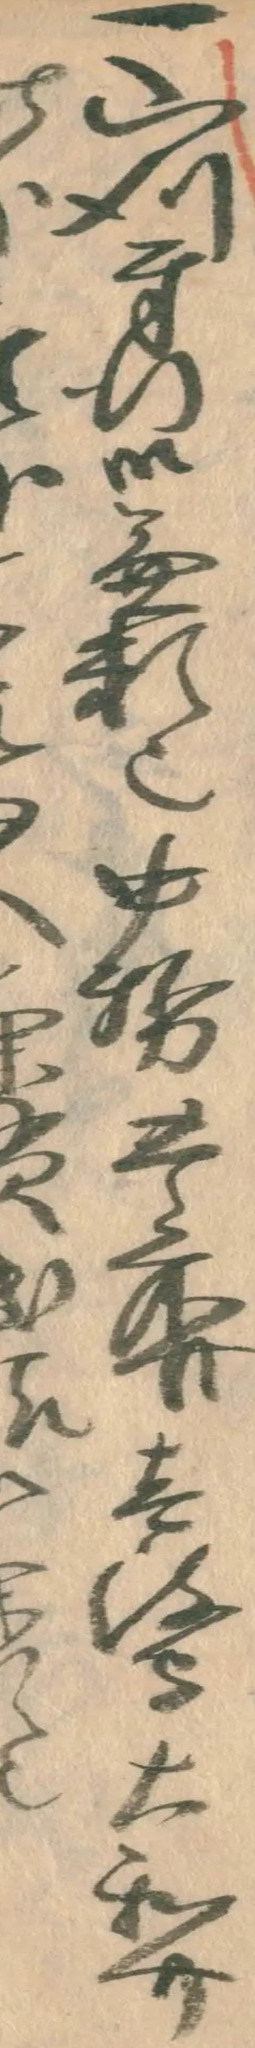一山刈奉行御兼頼也中務豊前介壱岐守大和介
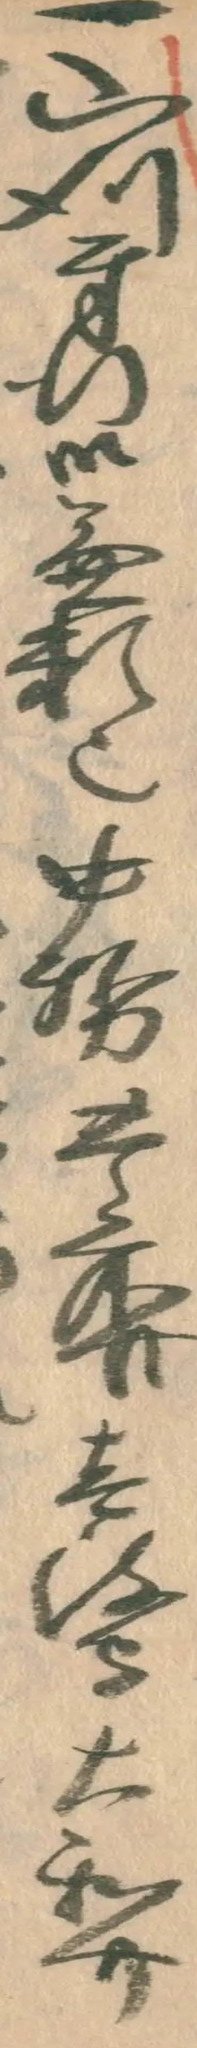一山刈奉行御兼頼也中務豊前介壱岐守大和介
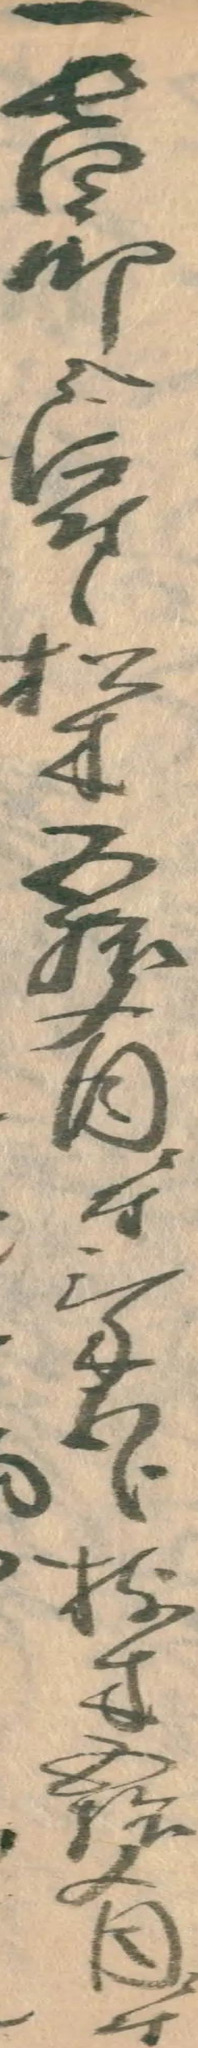一長四郎へ被仰付候松木五拾貫目ニ付三匁五分枝木五拾貫目ニ付
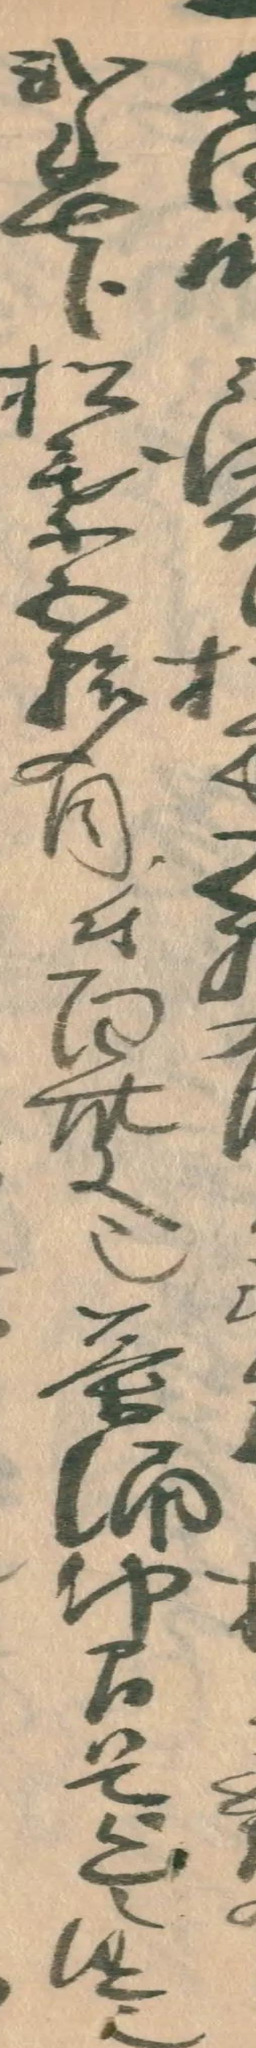弐匁七分松葉五拾貫目ニ付百卅文也仲間是迄之通也
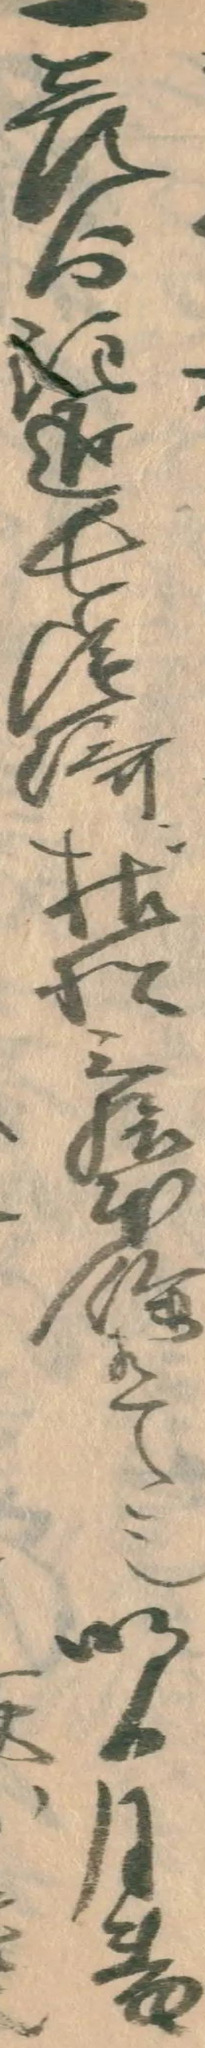一彦右衛門注進長尾崎ニ枯松三拾本余有之也明日月番
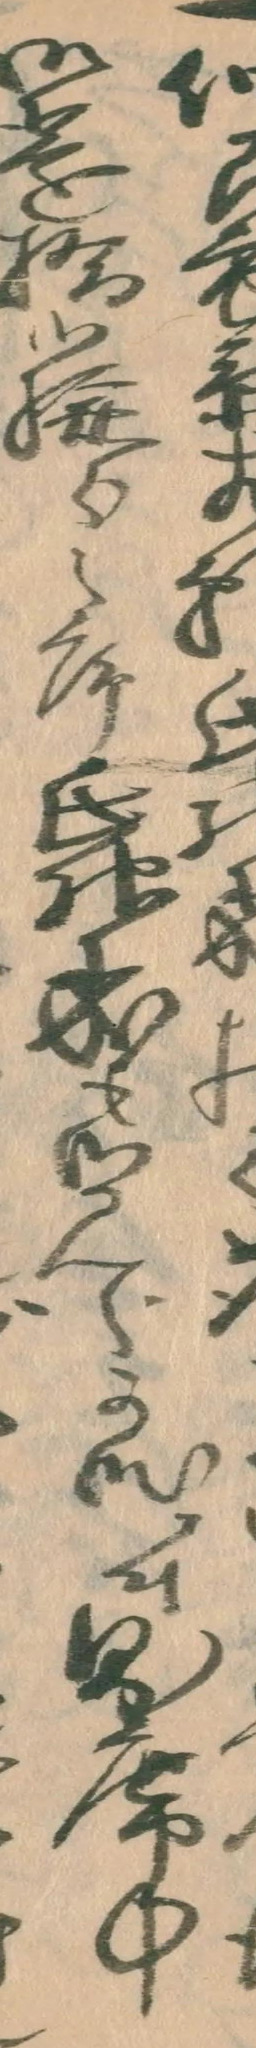御薗橋御検分之序氏神森も御見分可然ニ付則席中
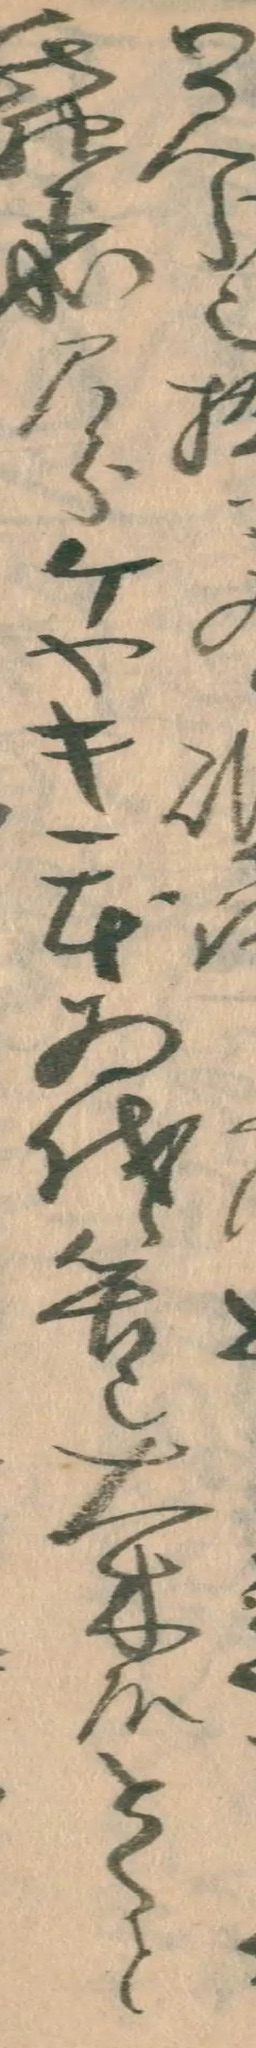氏神森見分ケヤキ一本為伐候筈也大木故とくと
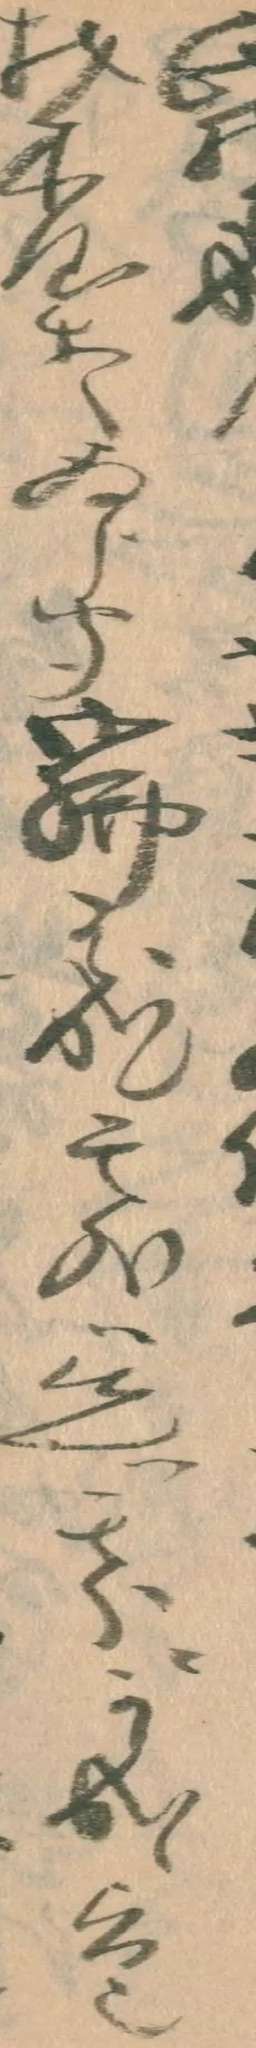材木屋等へ為申聞御可被成候其外ハ先ツ其分ニ可成候旨也
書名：賀茂社記録. 第60冊
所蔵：国立国会図書館 National Diet Library, JAPAN
